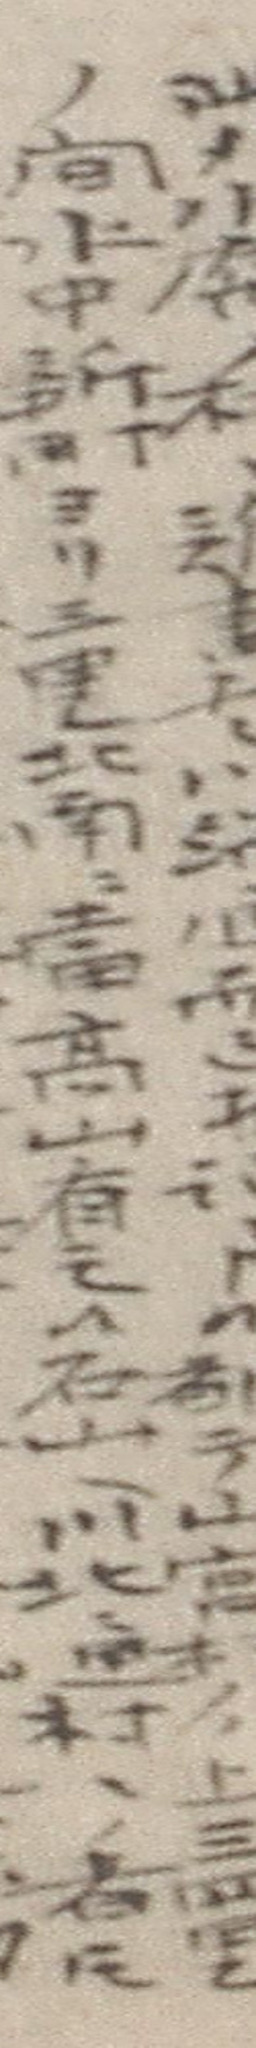ノ間水中新町ヨリ三里北南ニ当高山有之石山ヘ川北通村々ノ者トモ
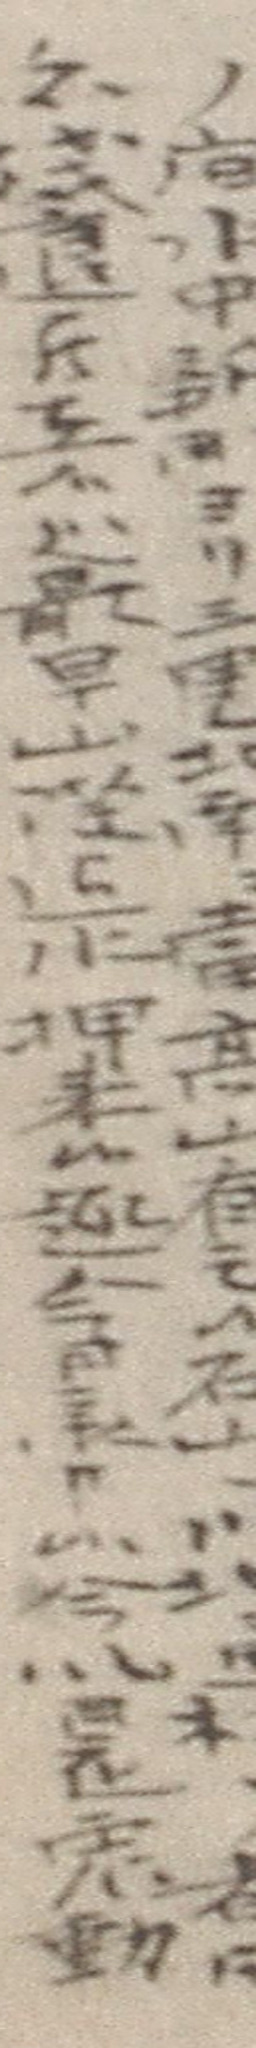不残潰罷在候処最早山際迄水押来候趣今日承候処今以是震動
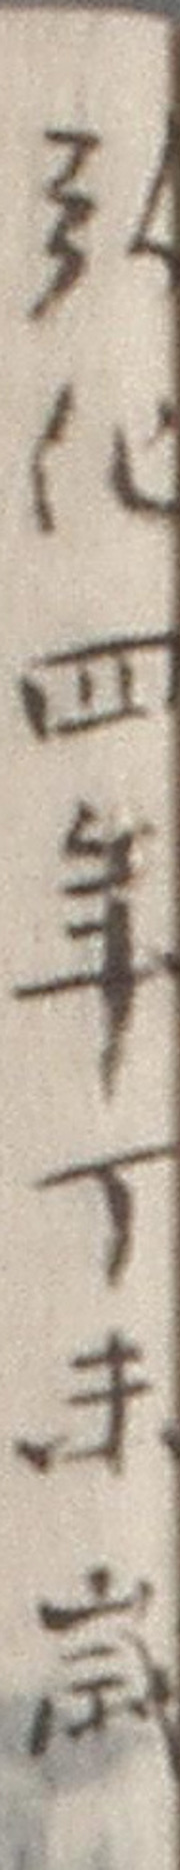弘化四年丁未歳
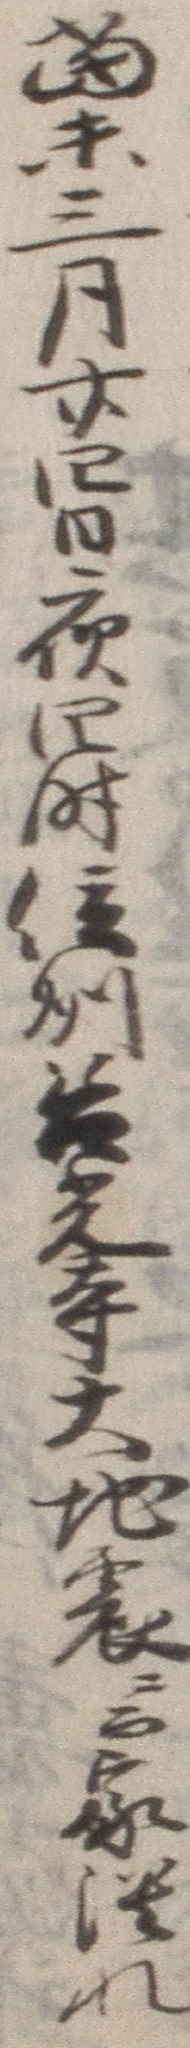当未三月廿四日夜四時信州善光寺大地震に而家潰れ
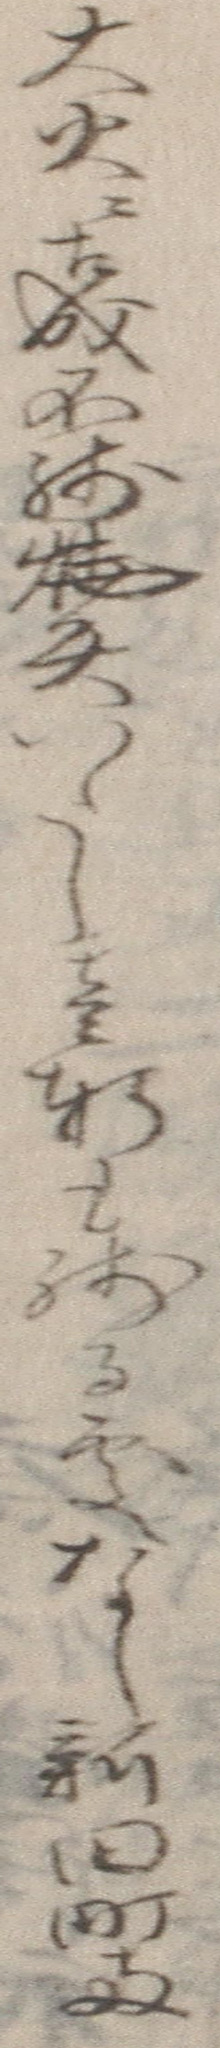大火に相成不残焼失いたし壱軒も残る處なし新田町両
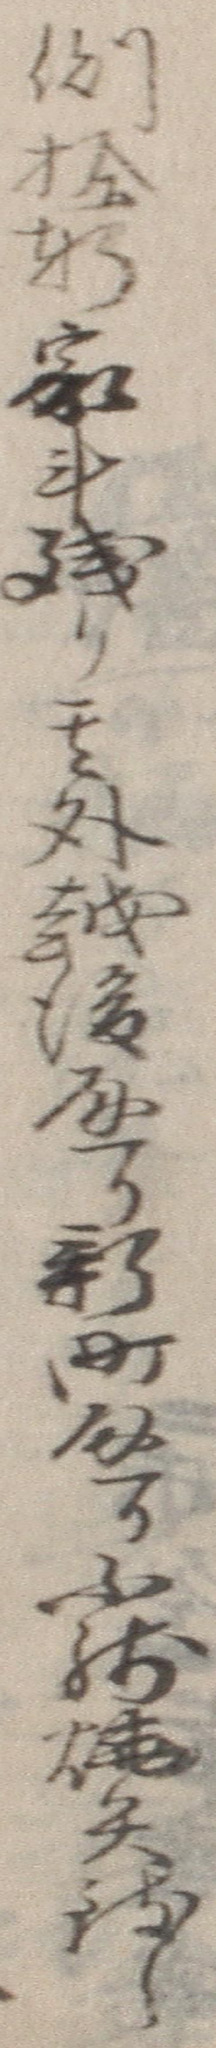側拾軒家斗残り其外越後通り新町通り不残焼失致し
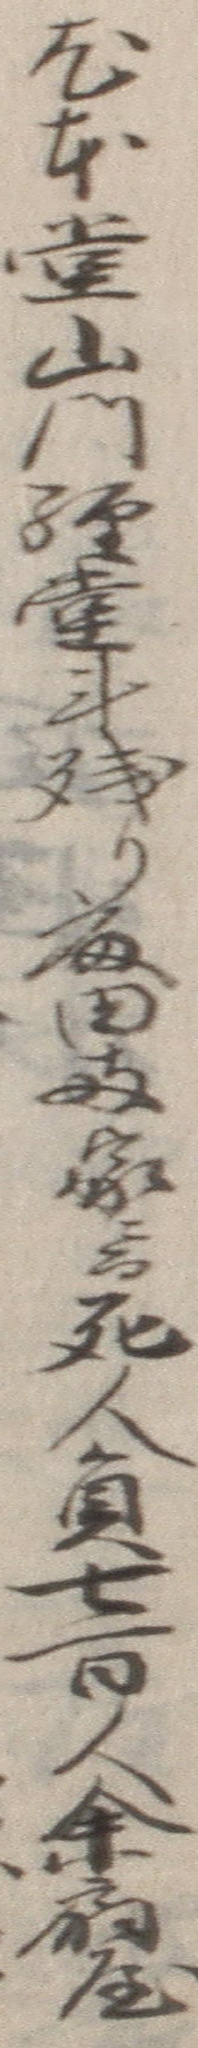尤本堂山門経堂斗残り藤田両家二而死人負七百人余扇屋
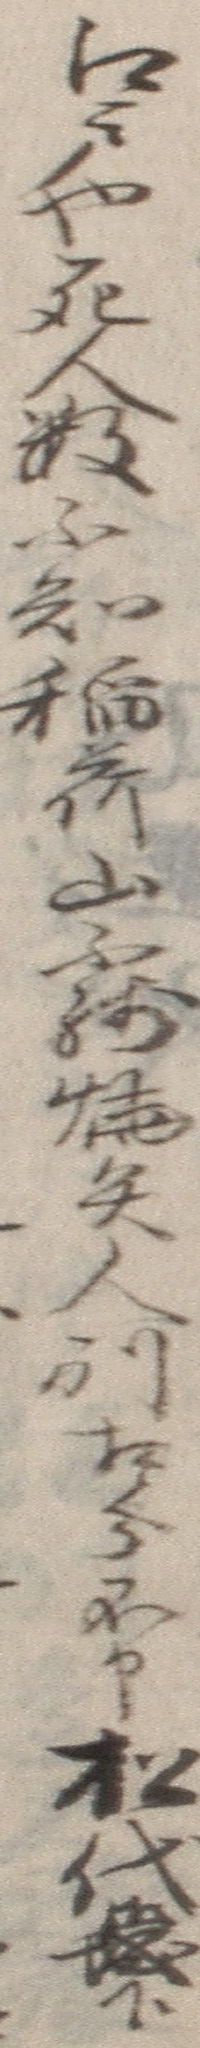江戸や死人数不知稲荷山不残焼失人別相分り不申松代御城下
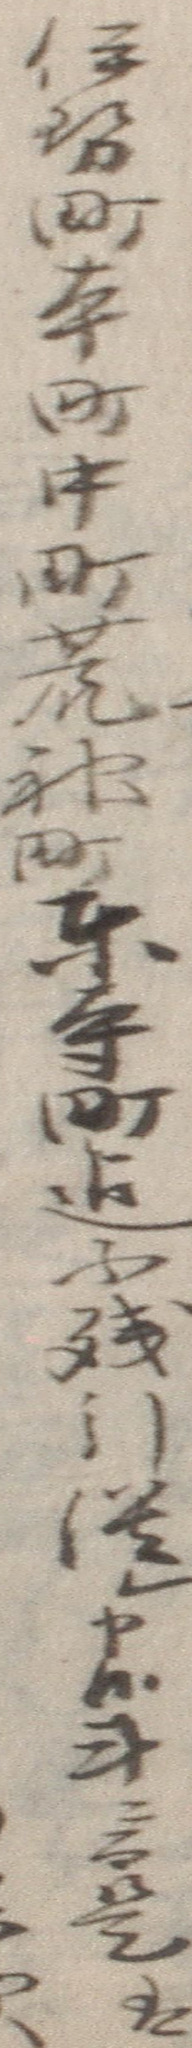伊勢町本町中町荒神町東寺町迄不残引潰レ申候斗二而是は
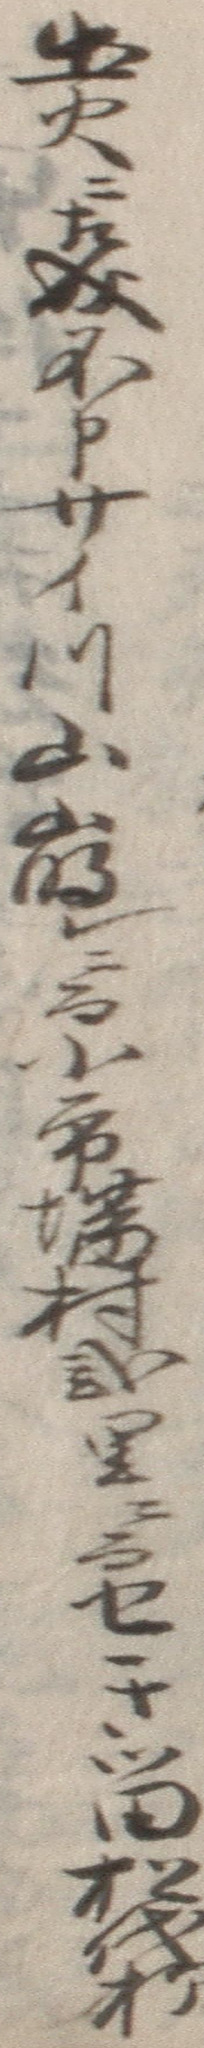出火に相成不申サイ川山崩レ二而小市場村弐里二而セキ留松代様
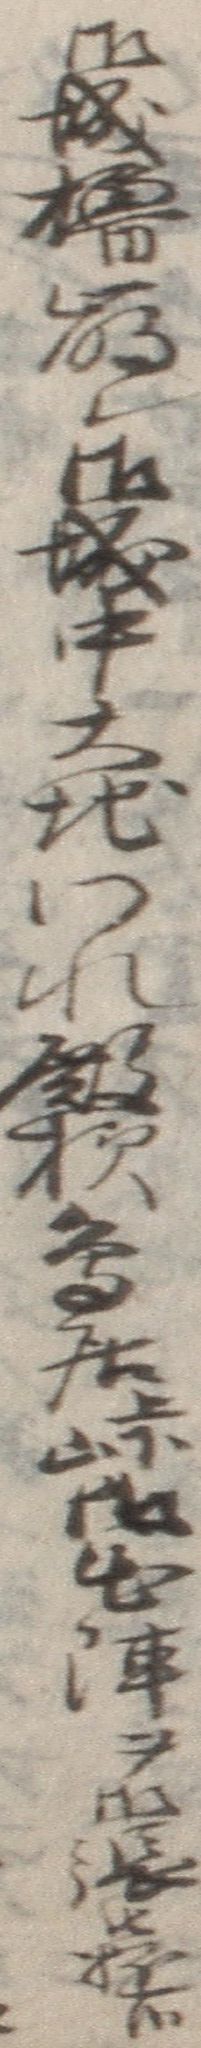御城櫓崩レ御城中大地ゆれ殿様鳥居峠御出陣ヲ御張被遊候
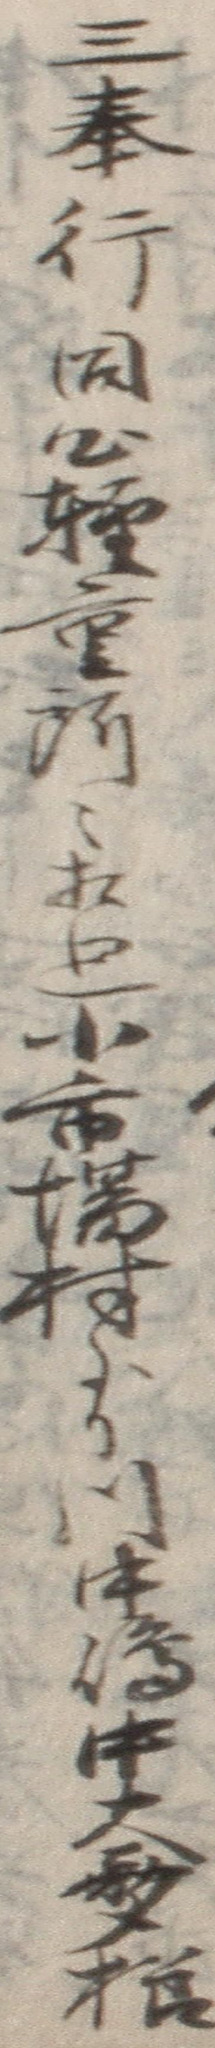三奉行同心軽重所々相廻小市場村より川中嶋中大勢櫛
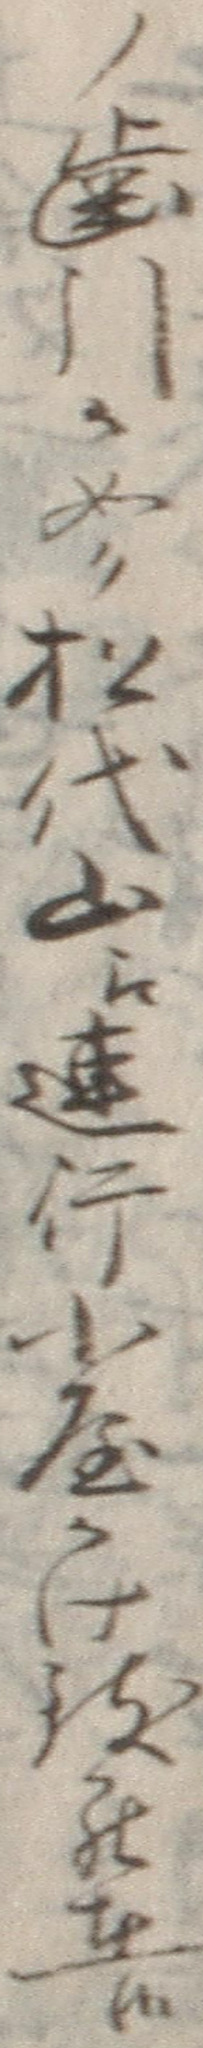ノ歯引か如く松代山え連行小屋かけ致罷在候
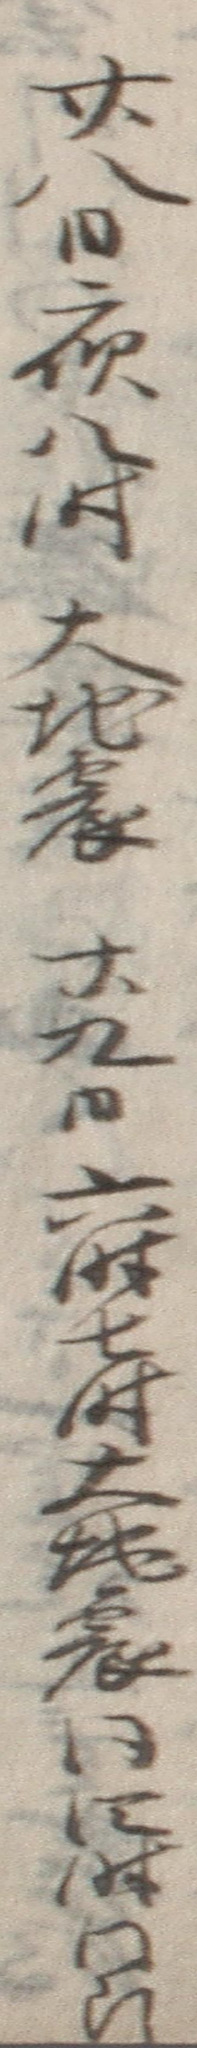廿八夜八時大地震廿九日六時七時大地震同四時同断
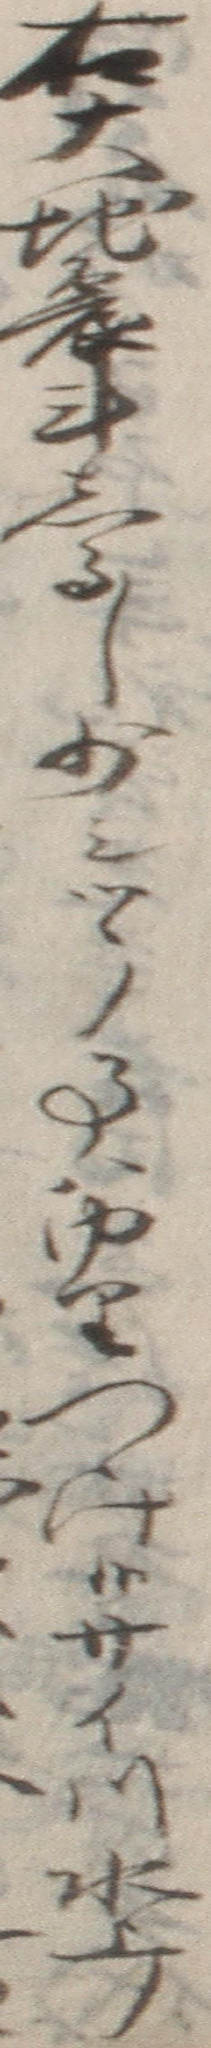右大地震斗しるし少シツゝノ事ハゆりつゝけ候さい川水上ノ
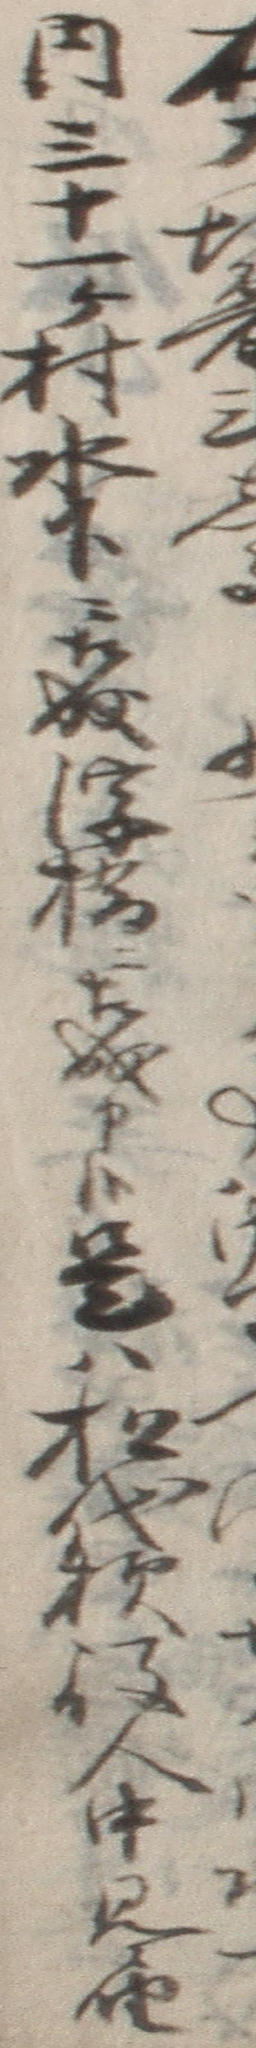内三十一ケ村水下に相成浮橋二相成申候是は松代様役人中見届
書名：[善光寺地震に関する冊子]
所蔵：東京大学地震研究所図書室 Earthquake Research Institute Library, The University of Tokyo, JAPAN
